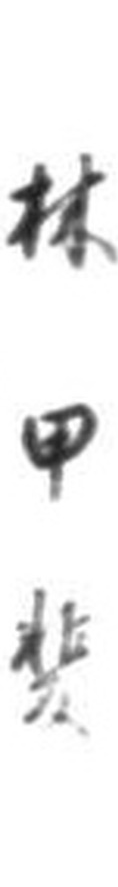林甲斐
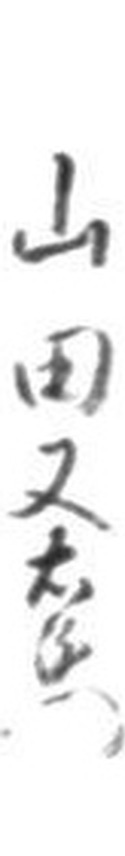山田又右衛門
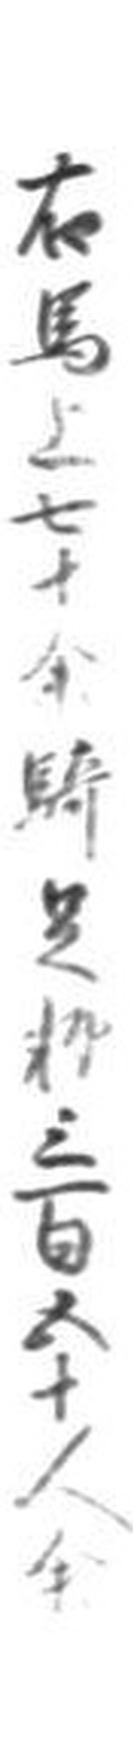右馬上七十余騎足軽三百五十人余
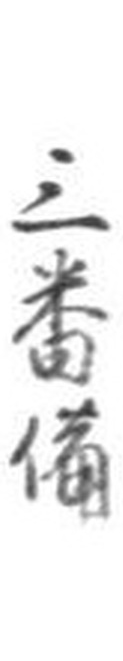三番備
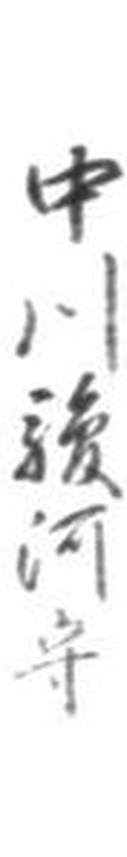中川駿河守

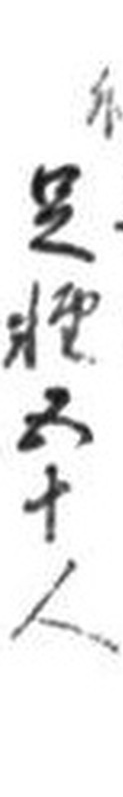外足軽五十人
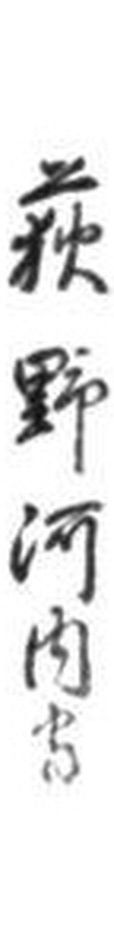荻野河内守
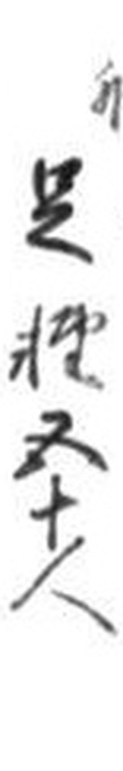足軽五十人
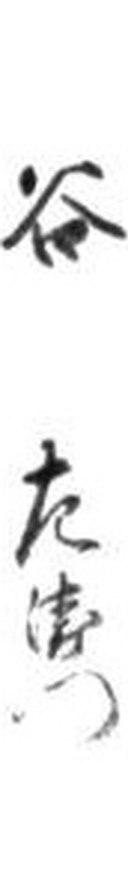谷左衛門
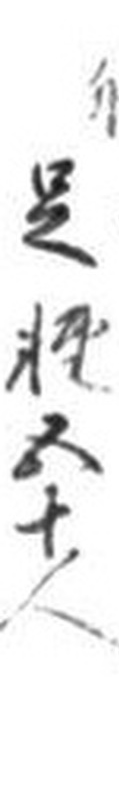足軽五十人
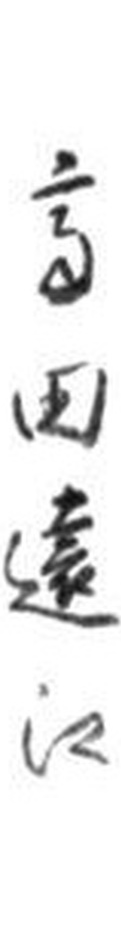高田遠江
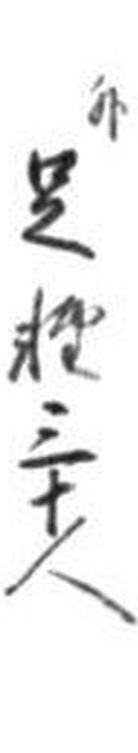外足軽三十人
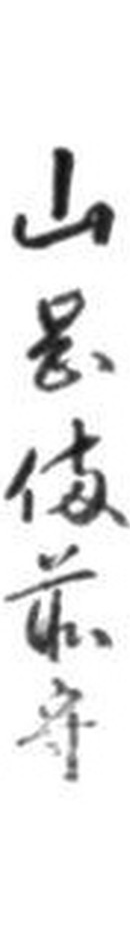山岡備前守
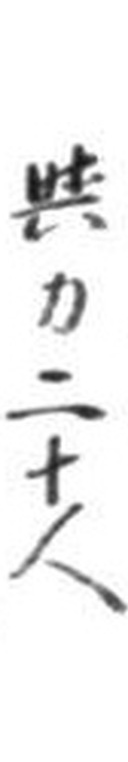与力二十人
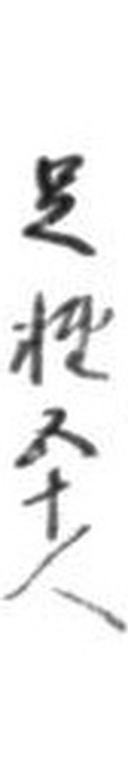足軽五十人
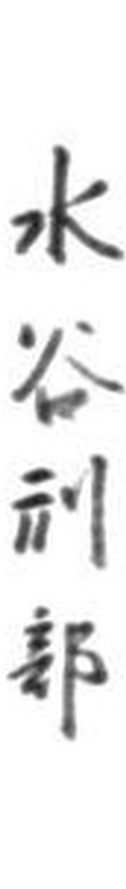水谷刑部
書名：家譜 二 忠直公 従文禄四年到慶安四年
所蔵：福井県文書館 Fukui Prefectural Archives
